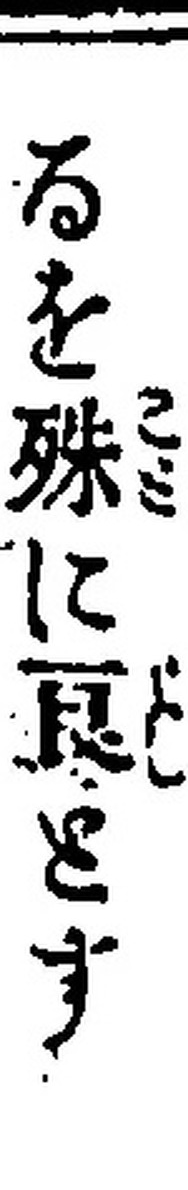るを殊に良とす
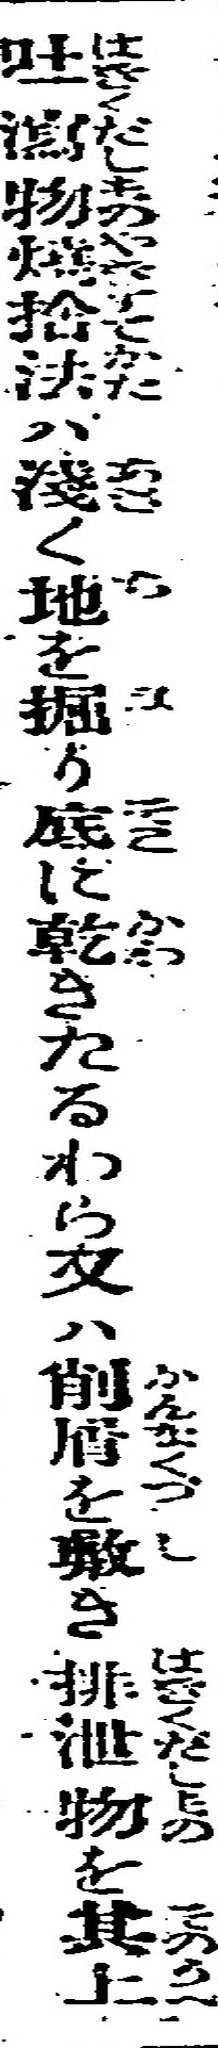吐瀉物焼捨法は淺く地を堀り底に乾きたるわら又は削屑を敷き排泄物を其上
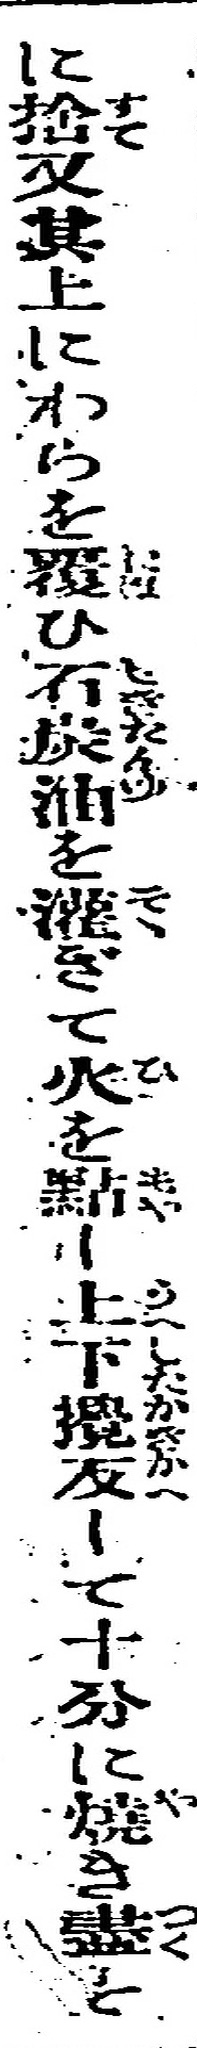に捨又其上にわらを覆ひ石炭油を濯ぎて火を點し上下攪反して十分に焼き盡す
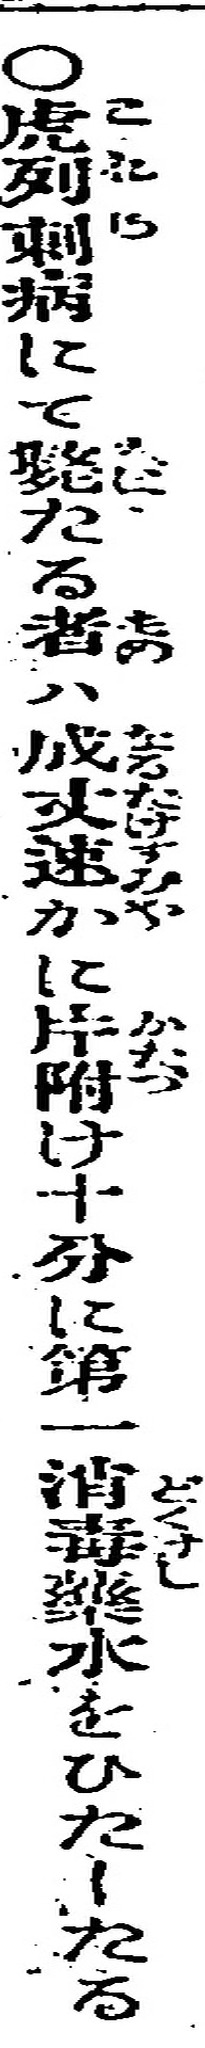〇虎列刺病にて斃たる者は成丈速かに片附け十分に第一消毒藥水をひたしたる
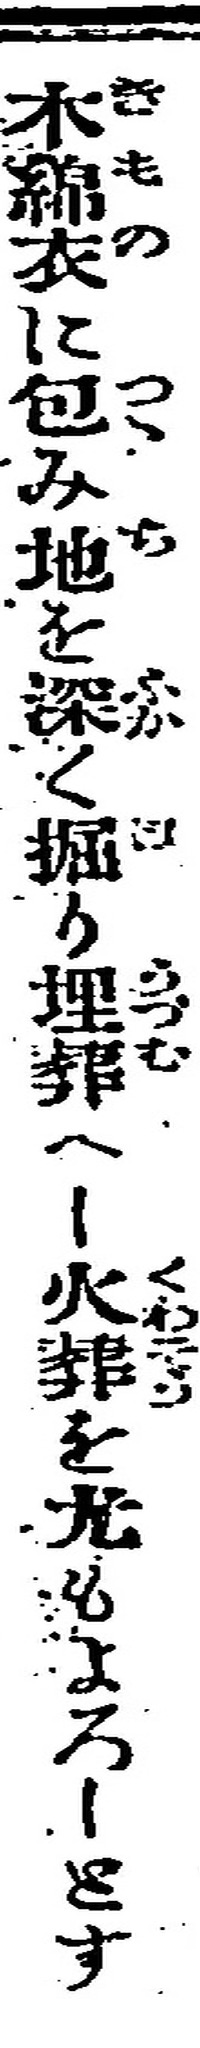木綿衣に包み地を深く堀り埋葬へし火葬を尤もよろしとす
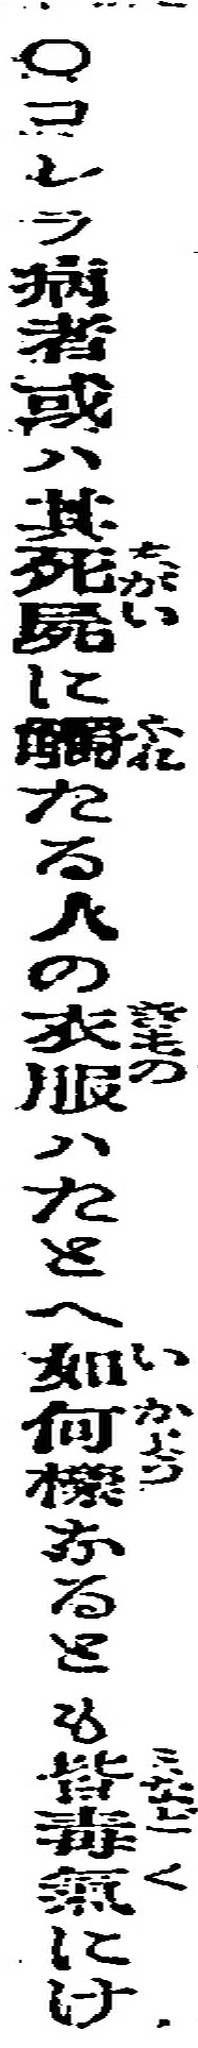〇コレラ病者或は其死屍に觸たる人の衣服はたとへ如何様なるとも皆毒氣にけ
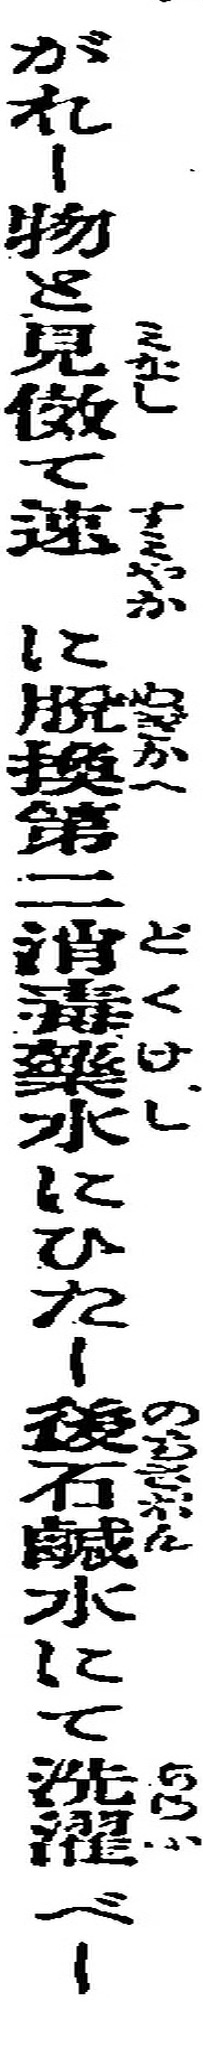がれし物と見做て速に脱換第二消毒藥水にひたし後石鹸にて洗濯べし
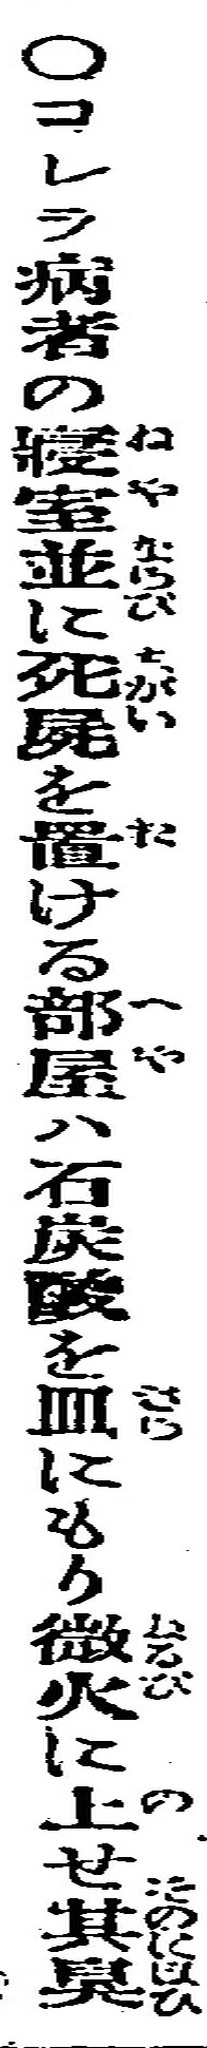〇コレラ病者の寝室並に死屍を置ける部屋は石炭酸を皿にもり微火に上せ其臭
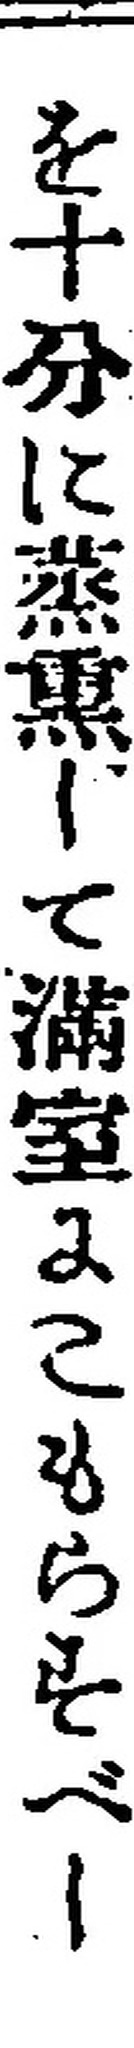を十分に蒸薫して満室にころらすべし
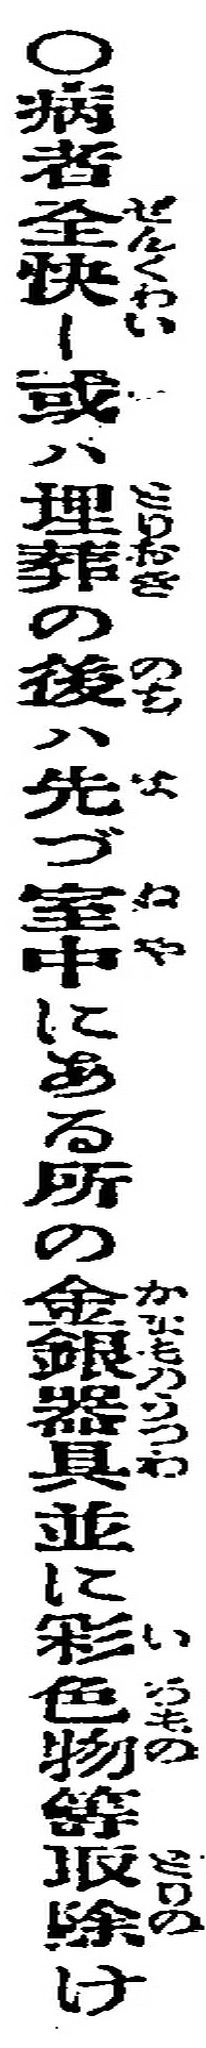〇病者全快し或は埋葬の後は先づ室中にある所の金銀器具並に彩色物等取除け
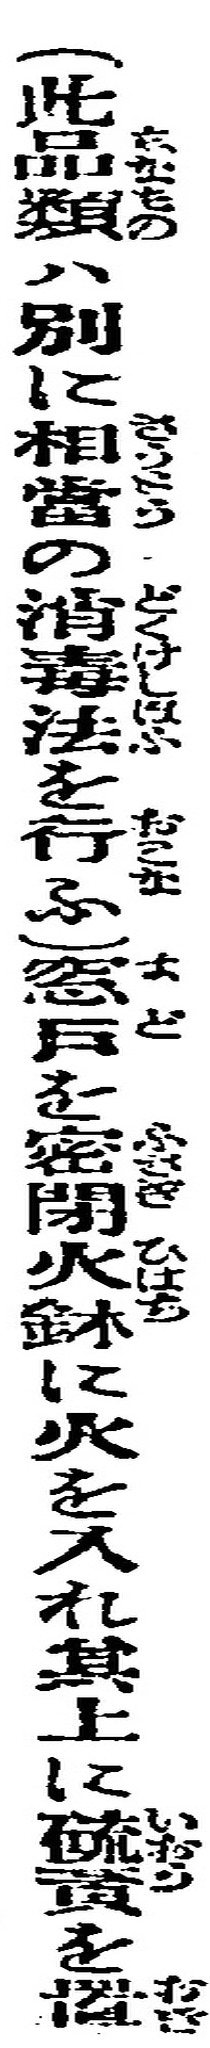[此品類は別に相當の消毒法を行ふ]窓戸を密閉火鉢に火を入れ其上に硫黄を置
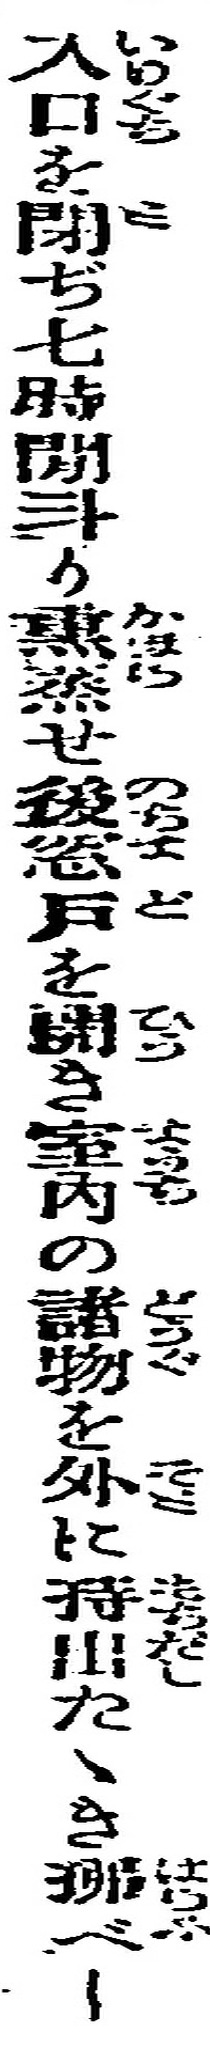入口を閉ぢ七時間斗り薫蒸せ後窓戸を開き室内の諸物を外に持出たゝき拂べし
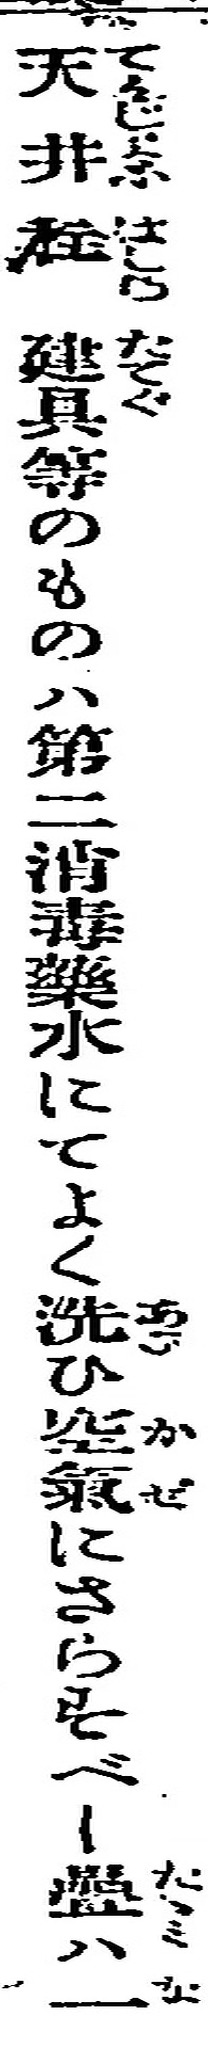天井柱建具等のものは第二消毒藥水にてよく洗ひ空氣にさらずべし畳は一
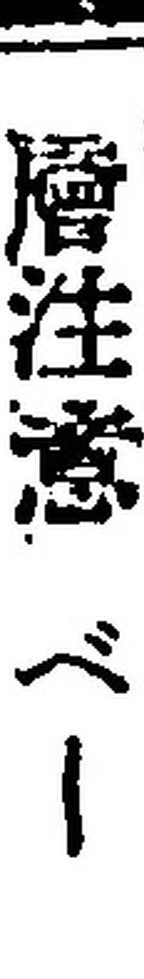層注意べし
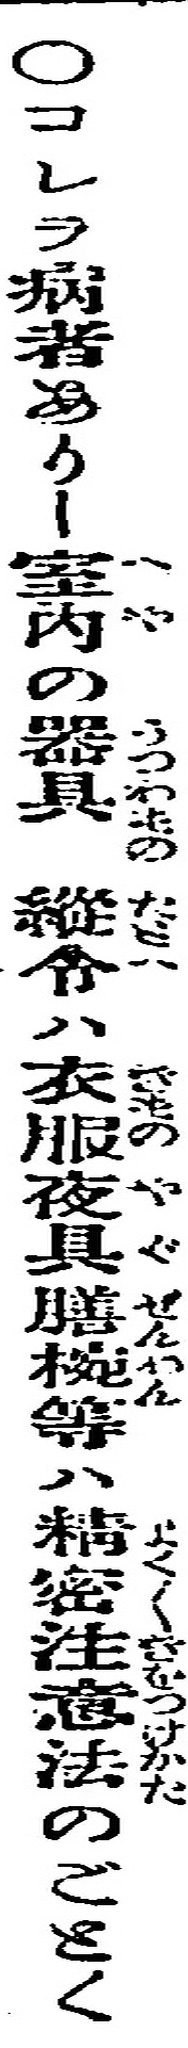〇コレラ病者ありし室内の器具縦令は衣服夜具膳椀等は精密注意法のごとく
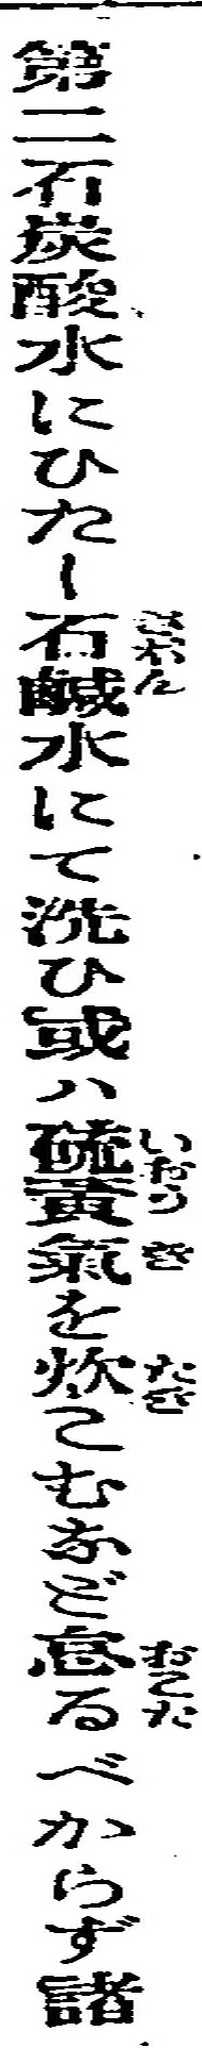第二石炭酸水にひたし石鹸水にて洗ひ或は硫黄氣を炊こむなど怠るべからず諸
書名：虎列剌病予防養生法訳解
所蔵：国立国会図書館 National Diet Library, JAPAN
